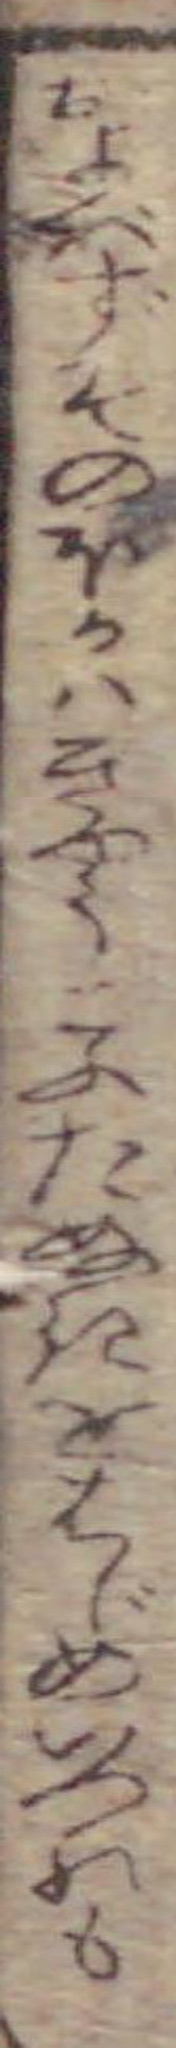およばずそのほかはきやうこふたぬきをはじめつれも
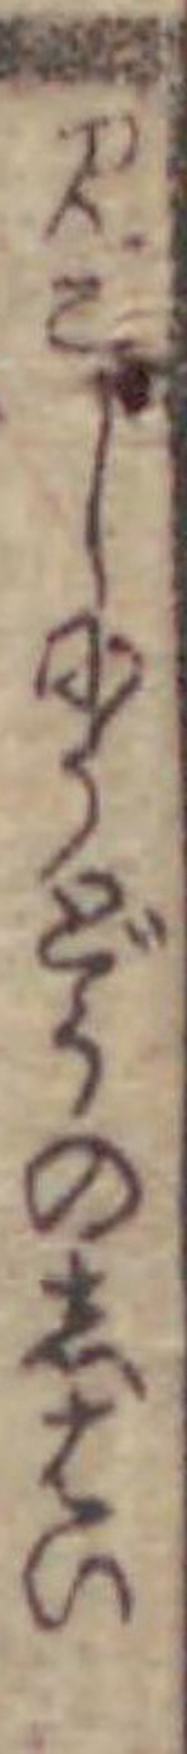見こしにうどうのしはい
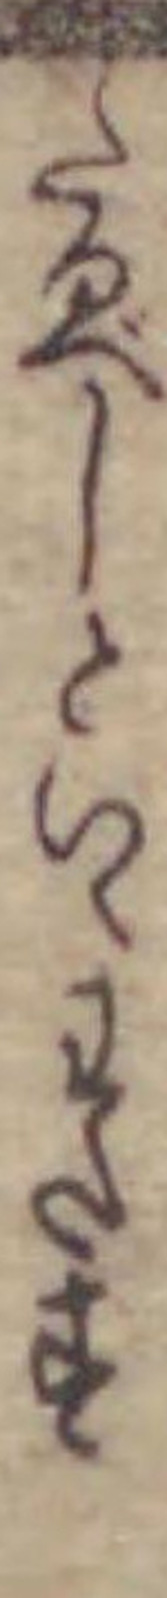たるべしといゝわたす
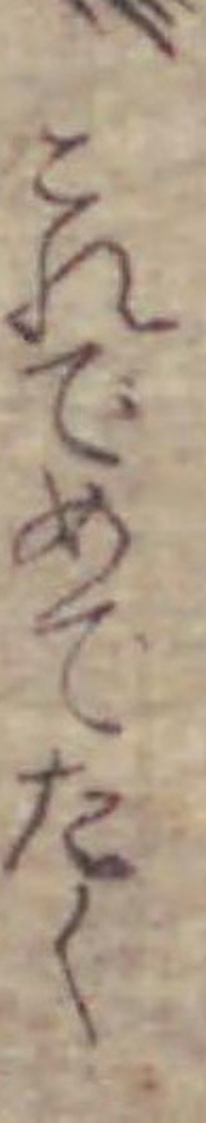これでめてたく
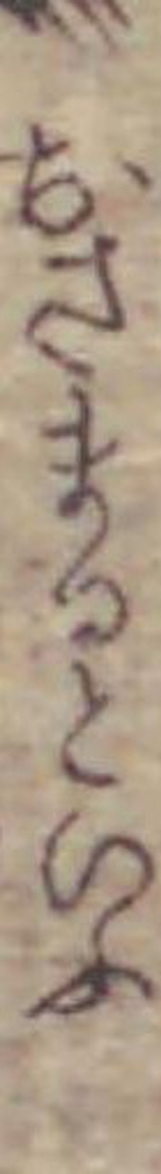おさまるといふ
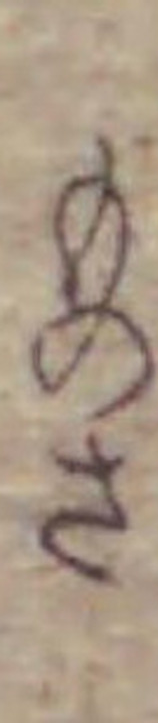ものさ
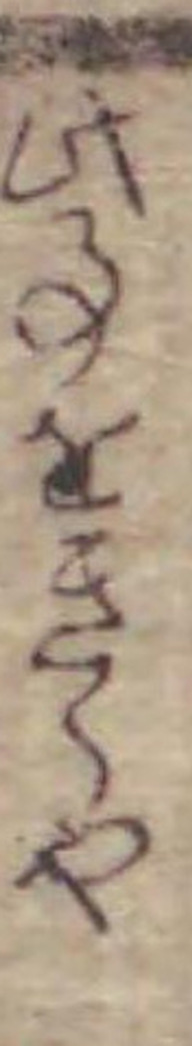此事をきくや
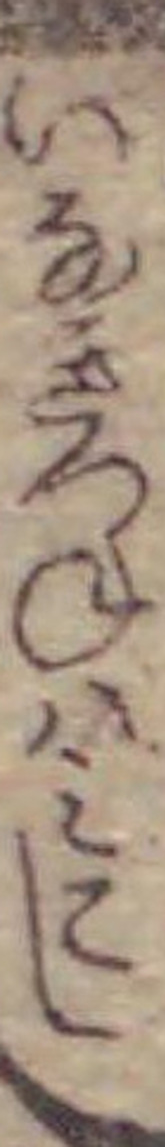いなきつねはみこし
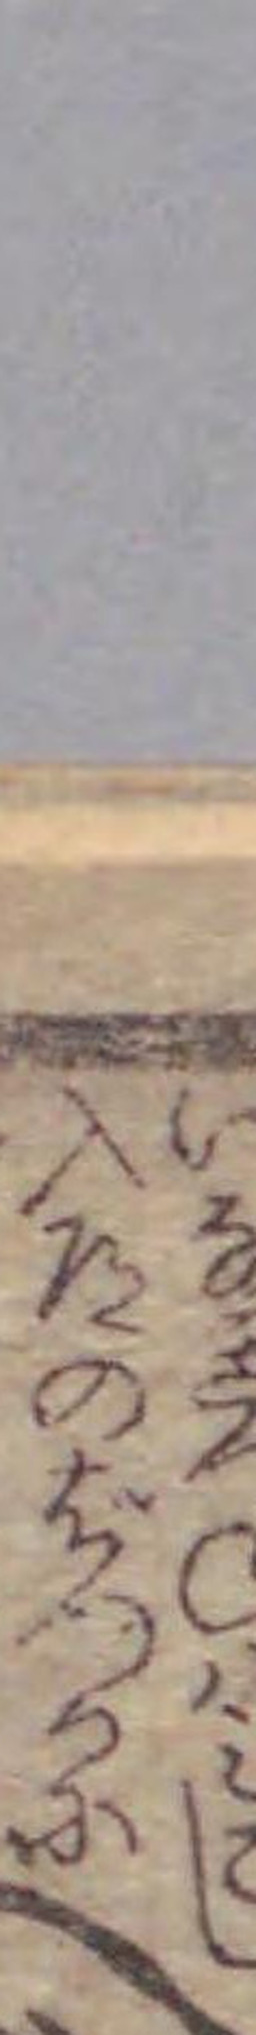入道のばつかに
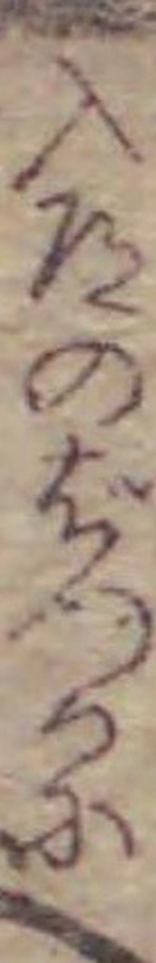入道のばつかに
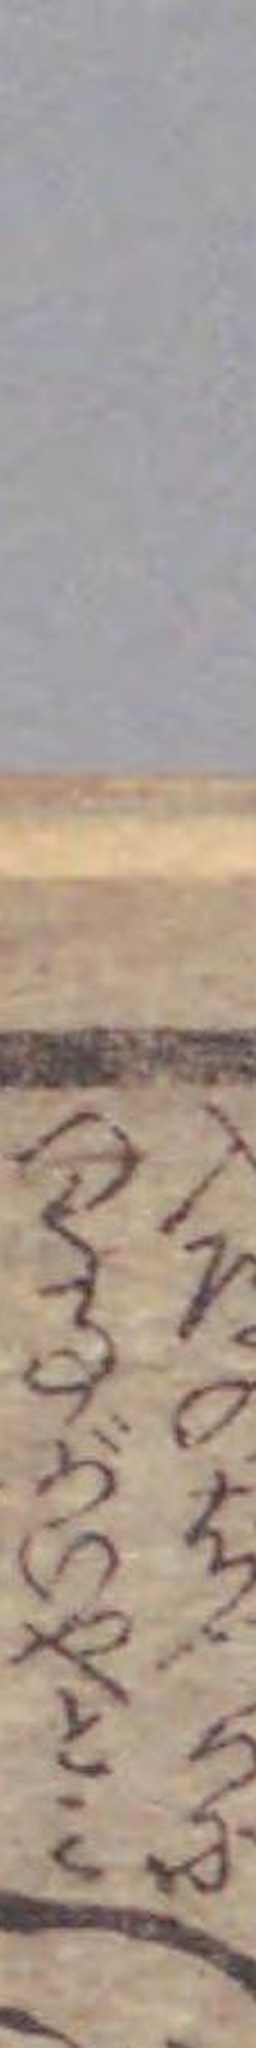つく事がいやとみ
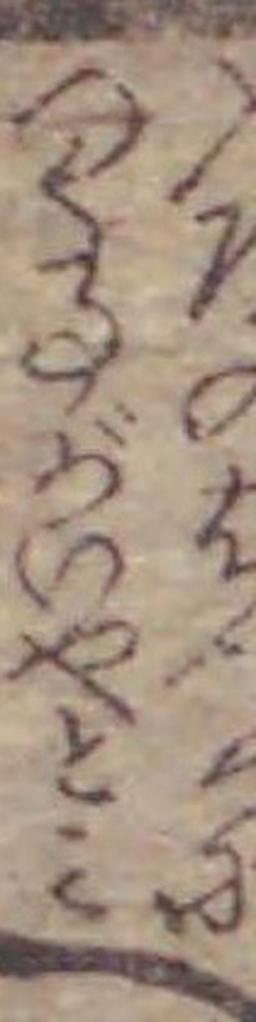つく事がいやとみ
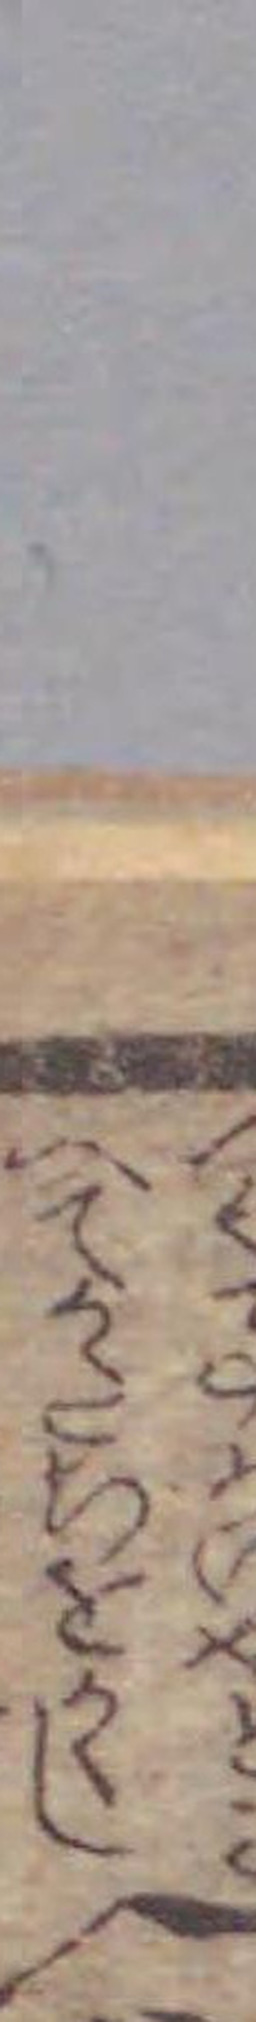へてかたちをかくし
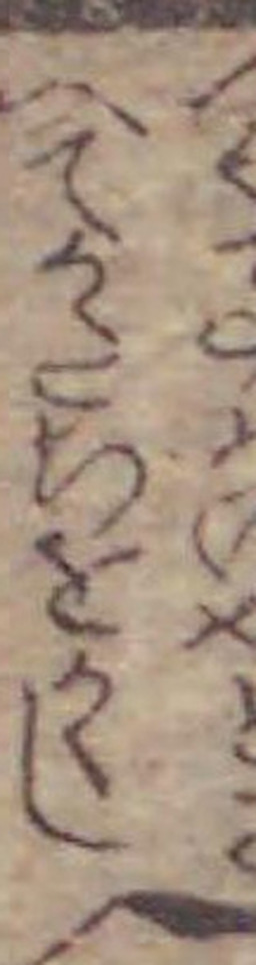へてかたちをかくし
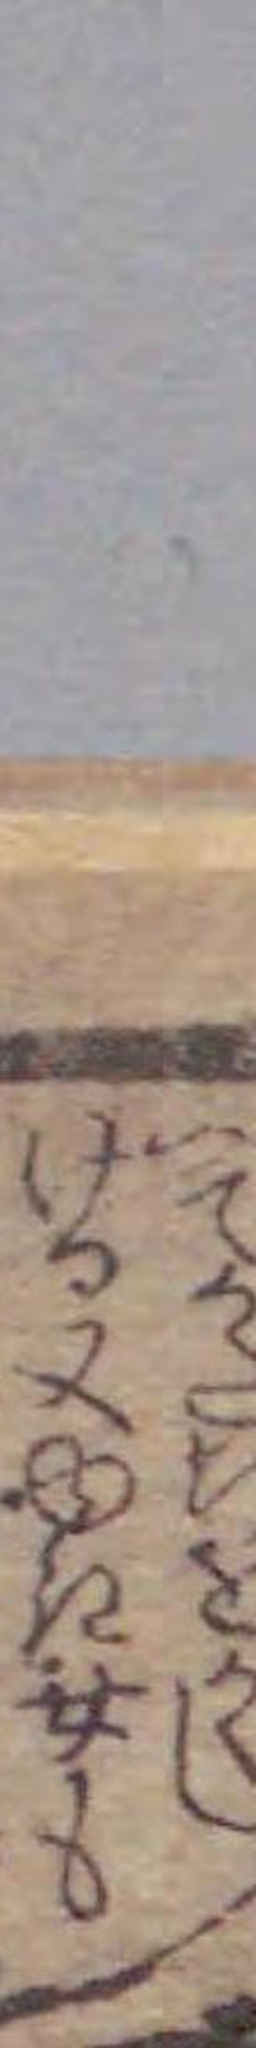ける又ゆき女も
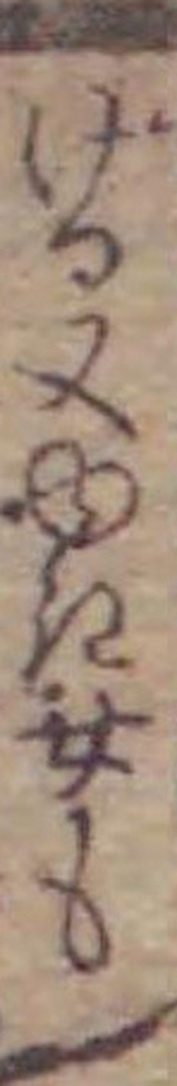ける又ゆき女も
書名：化物仲間破 : 2巻
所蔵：国立国会図書館 National Diet Library, JAPAN
